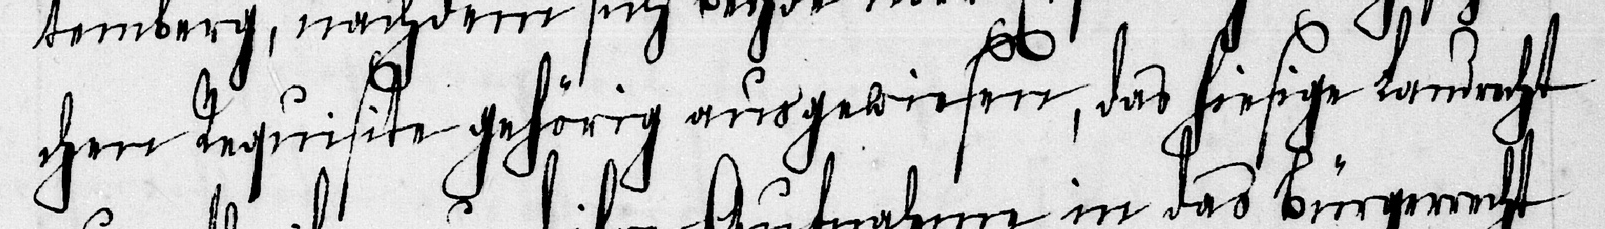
chen Inquisite gehörig ausgewiesen, das hiesige Landrecht
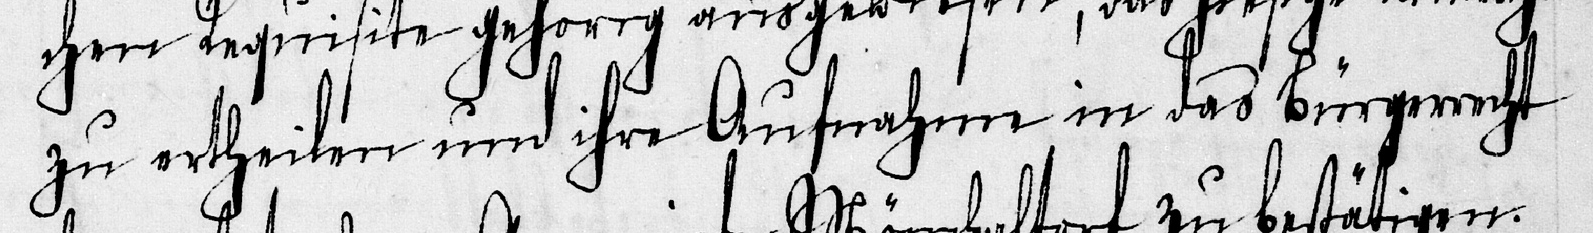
zu ertheilen und ihre Aufnahme in das Bürgerrecht
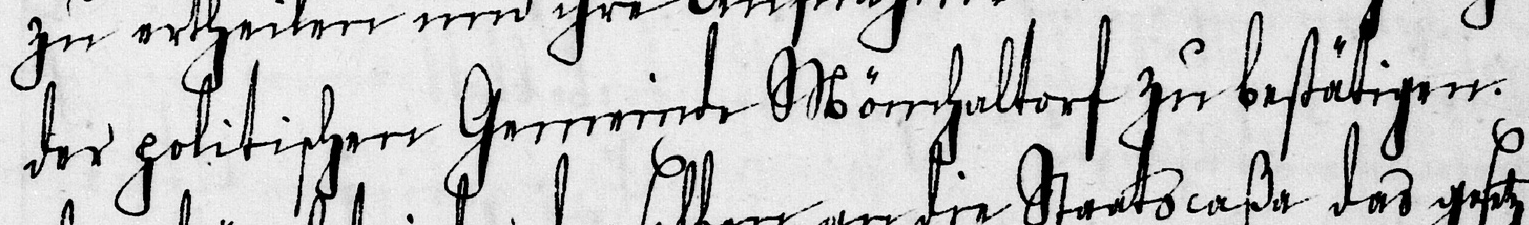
der politischen Gemeinde Mönchaltorf zu bestätigen.
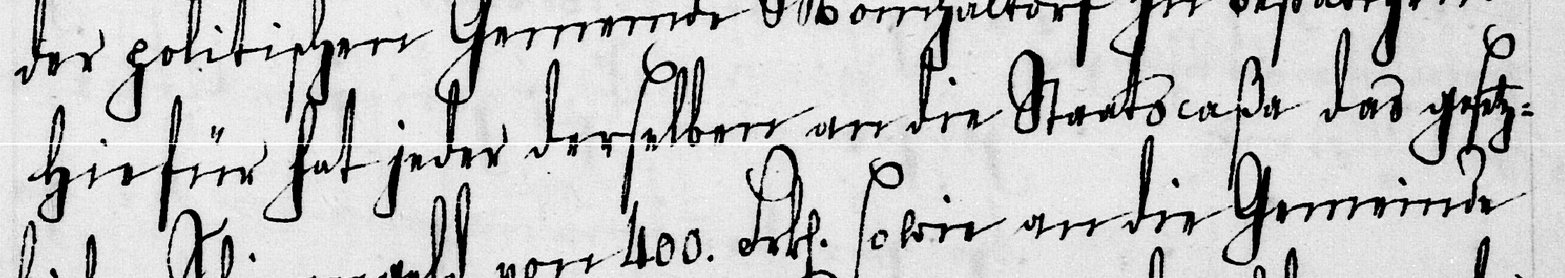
Hiefür hat jeder derselben an die Staatscaßa das gesetz¬
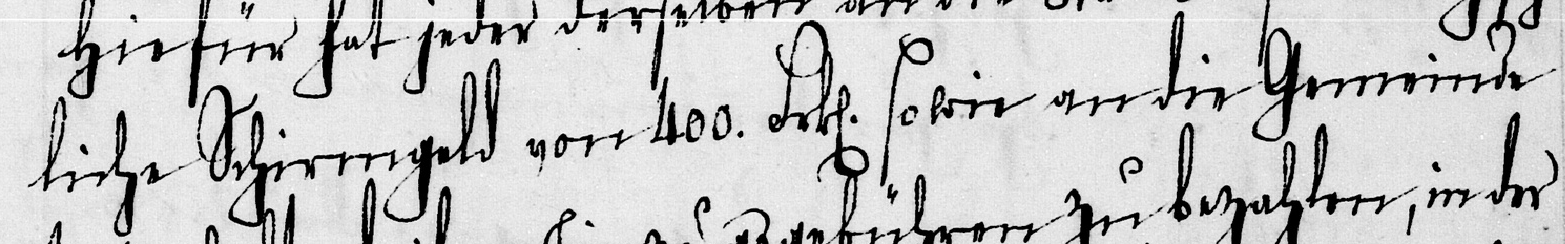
liche Schirmgeld von 400. Frk[en]. sowie an die Gemeinde
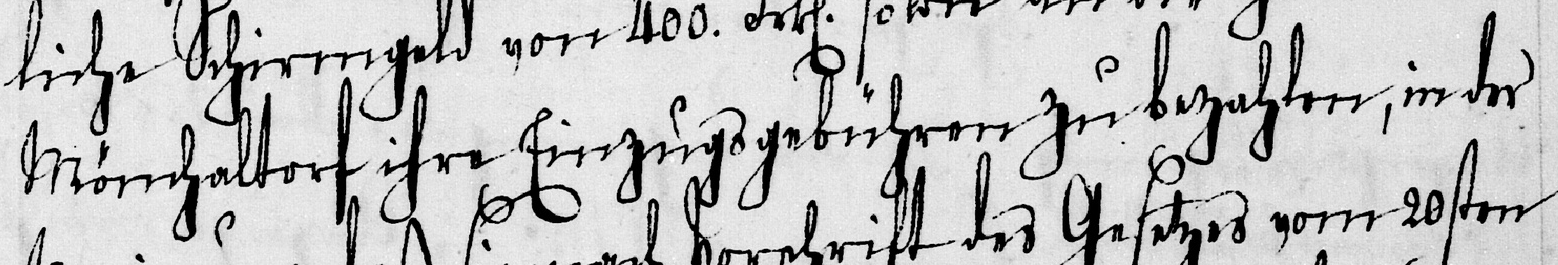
Mönchaltorf ihre Einzugsgebühren zu bezahlen, in der
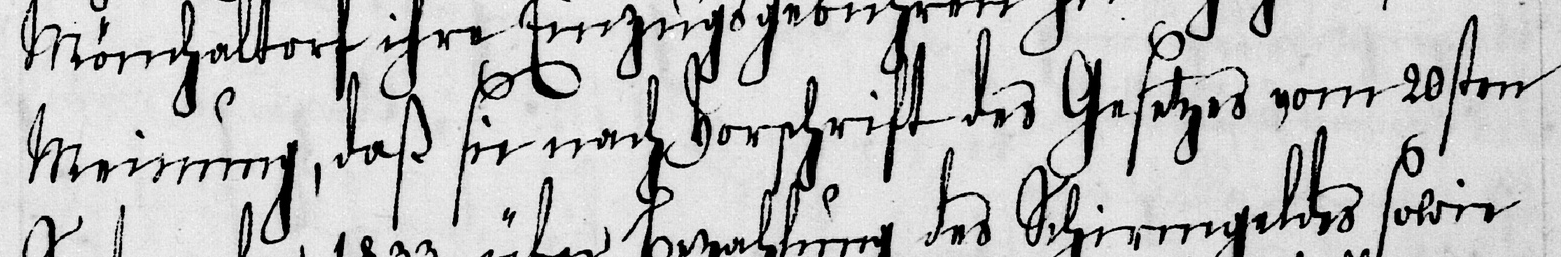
Meinung, daß sie nach Vorschrift des Gesetzes vom 20ten
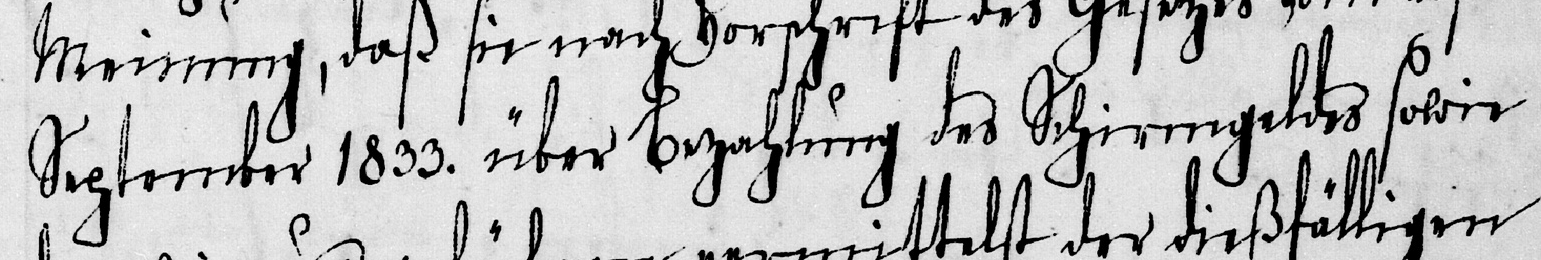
September 1833. über Bezahlung des Schirmgeldes sowie
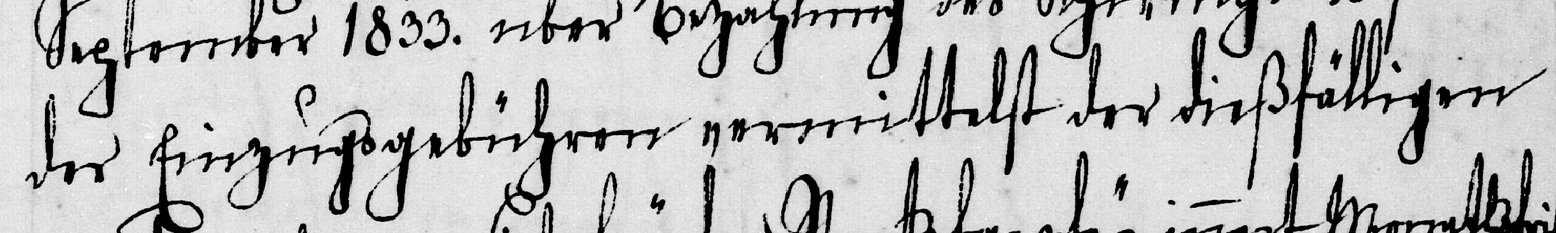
der Einzugsgebühren vermittelst der dießfälligen
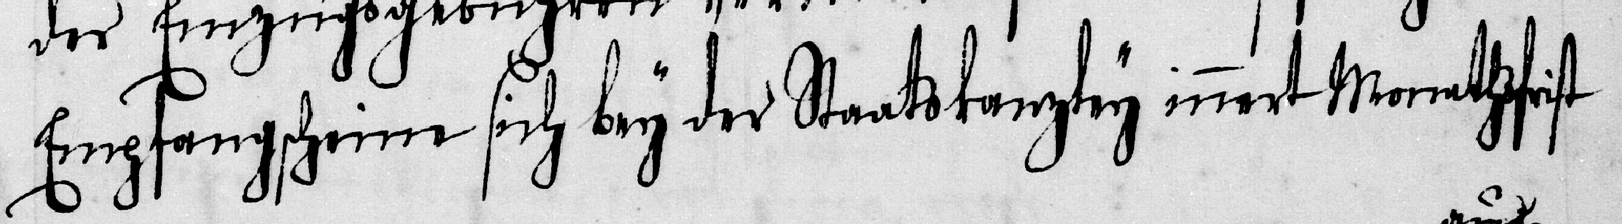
Empfangscheine sich bey der Staatskanzley innert Monathsfrist
